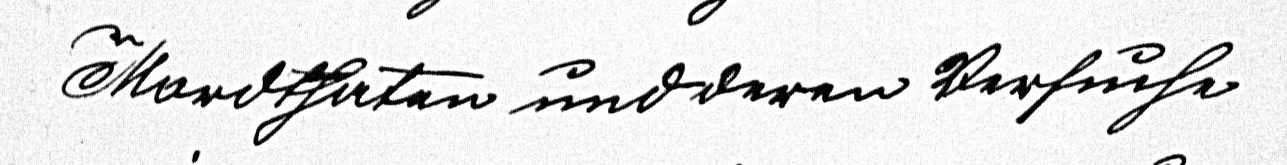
Mordthaten und deren Versuche
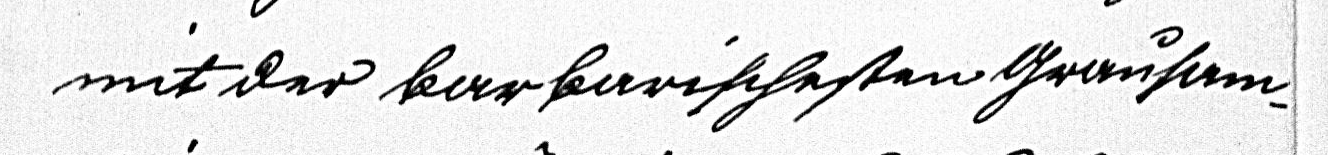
mit der Barbarischesten Grausam¬
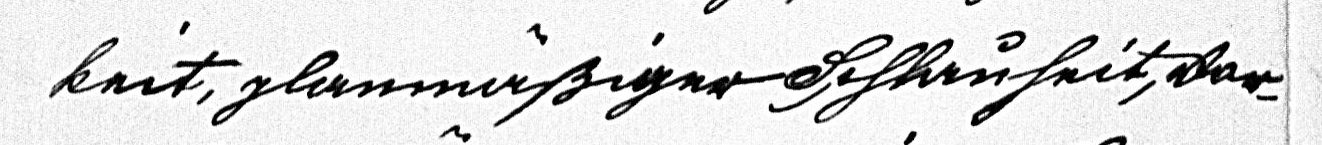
keit, planmäßiger Schlauheit, vor¬
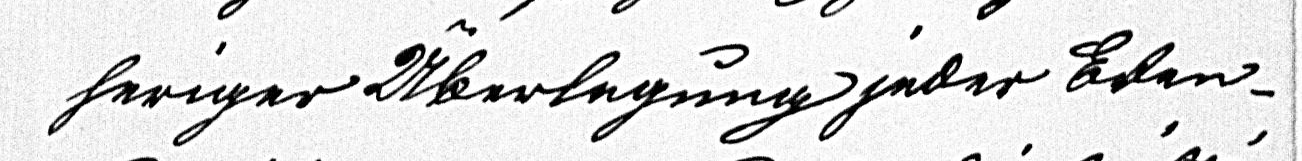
heriger Überlegung jeder Even¬
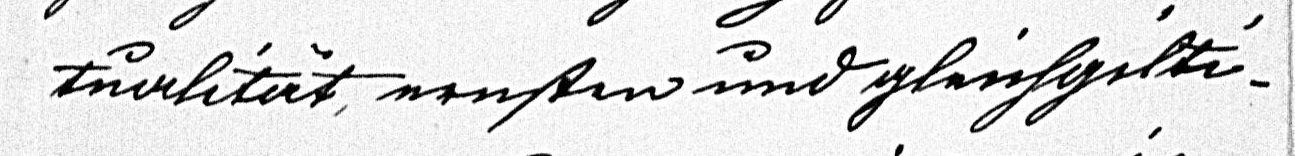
tualität, ernsten und gleichgilti¬
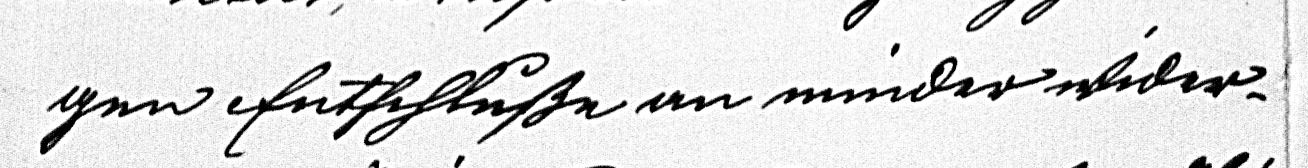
gen Entschluße an minder wider¬
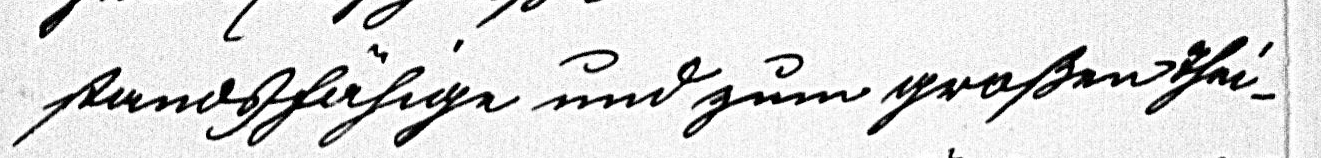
standsfähige und zum großen Thei¬
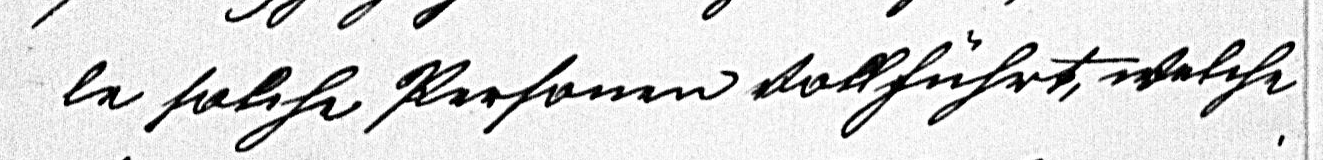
le solche Personen vollführt, welche
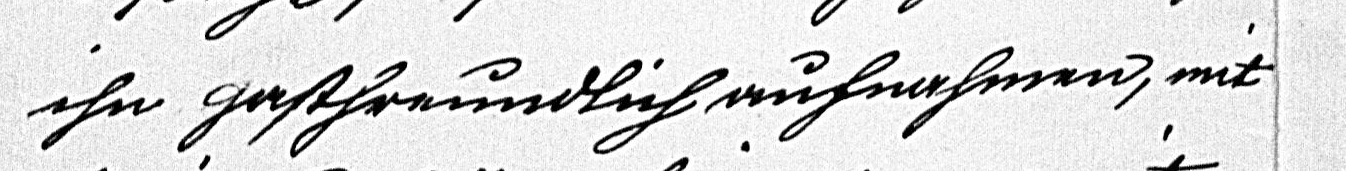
ihn gastfreundlich aufnahmen, mit
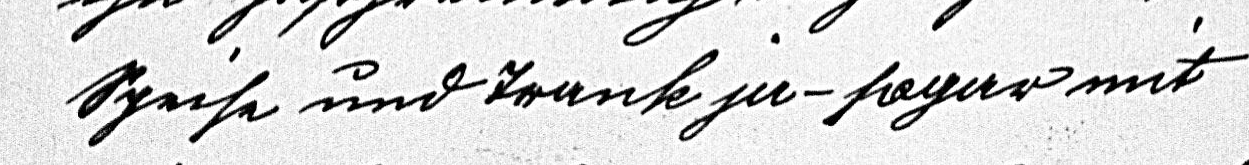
Speise und Trank ja - sogar mit
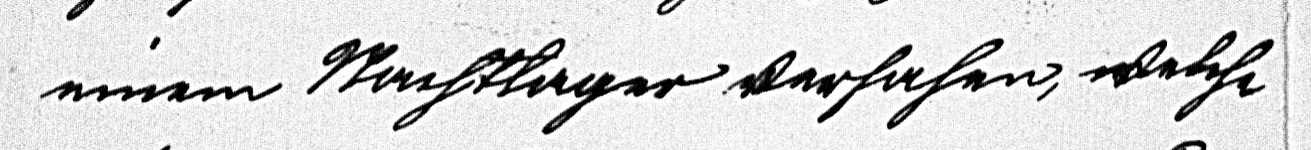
einem Nachtlager versahen, welche
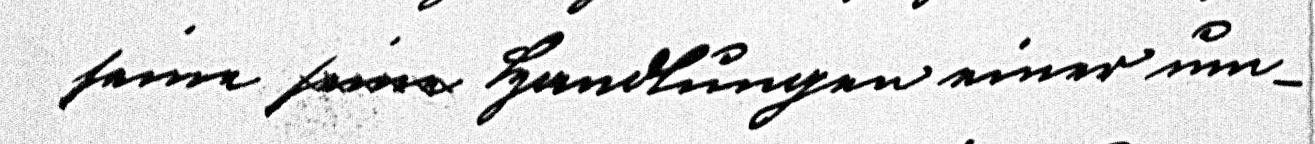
seine Handlungen einer um
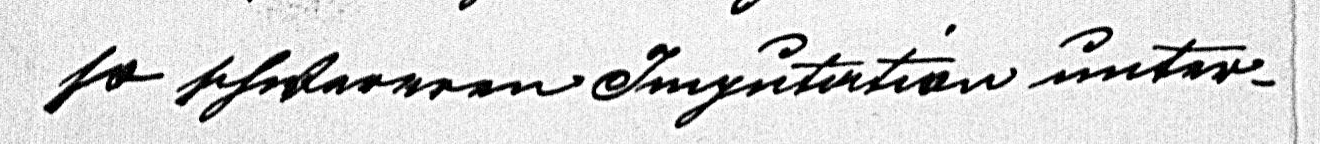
so schweren Imputation unter¬
